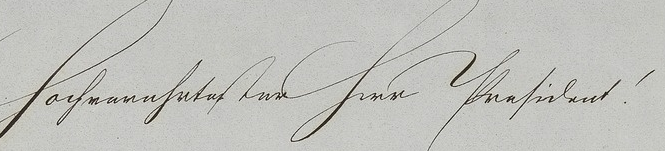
Hochverehrtester Herr President!
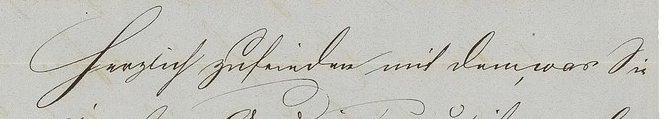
Herzlich zufrieden mit dem, was Sie
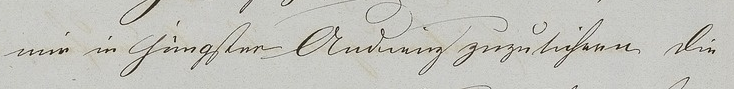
mir in jüngster Audienz zuzusichern die
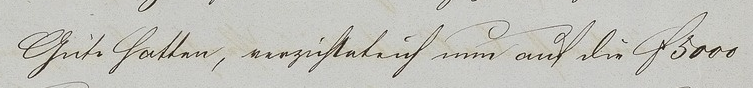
Güte hatten, verzichtete ich nun auf die F 5000
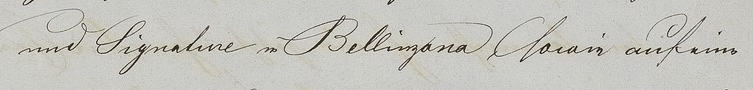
und Signature inBellinzona, sowie auf eine
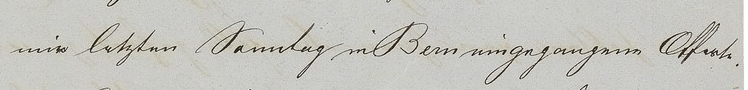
mir letzten Sonntag in Bern eingegangene Offerte.
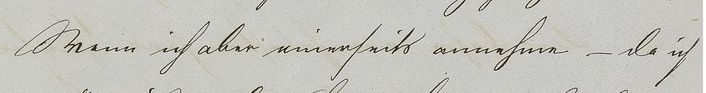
Wenn ich aber einerseits annehme – da ich
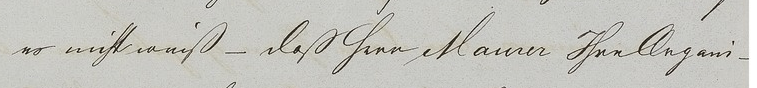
es nicht weiß – daß Herr Maurer Ihre Organi-
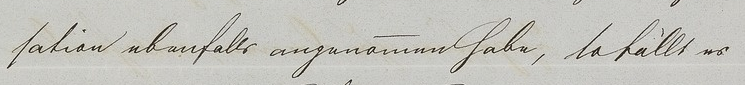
sation ebenfalls angenommen habe, so fällt es
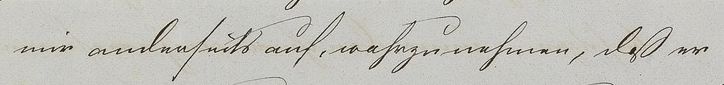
mir anderseits auf, wahrzunehmen, daß er
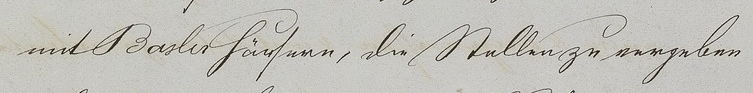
mit Basler Häusern, die Stellen zu vergeben
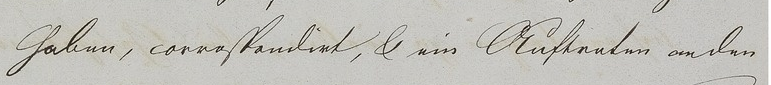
haben, correspondirt, & ein Auftreten an den
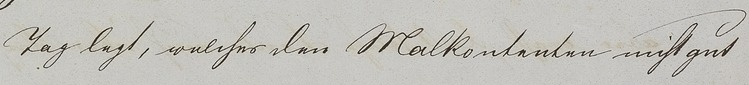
Tag legt, welches den Malkontenten nicht gut
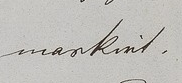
maskirt.
